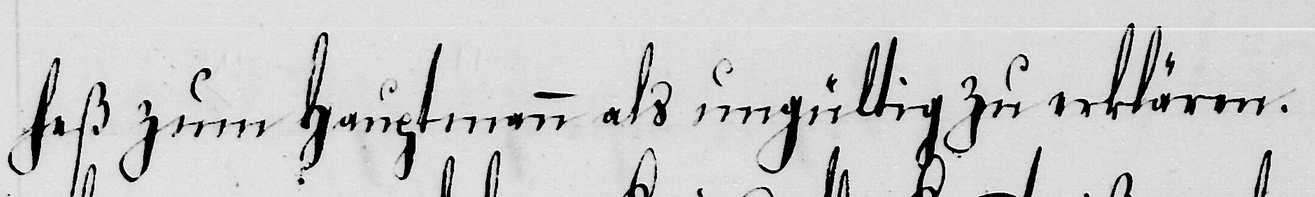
theß zum Hauptmann als ungültig zu erklären.
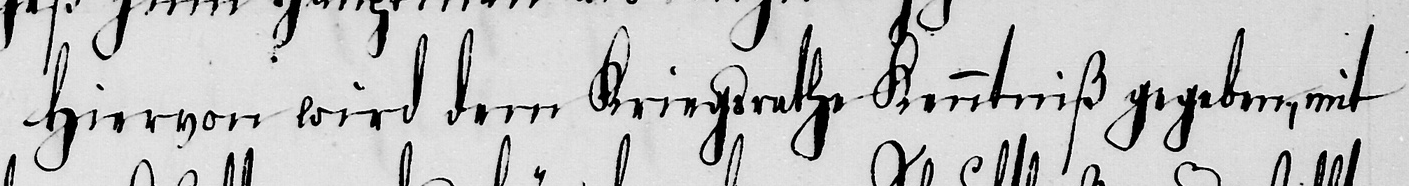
Hiervon wird dem Kriegsrathe Kenntniß gegeben, mit
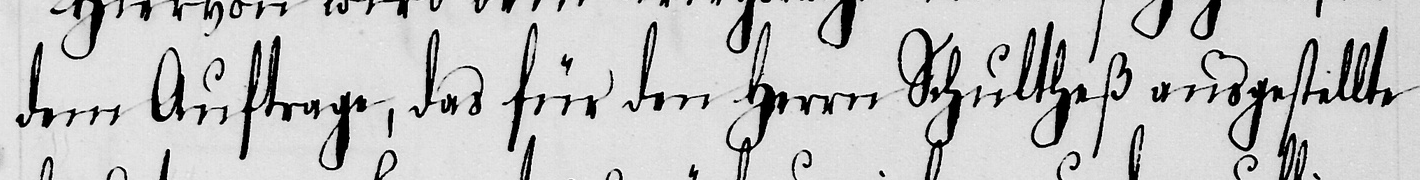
dem Auftrage, das für den Herrn Schultheß ausgestellte
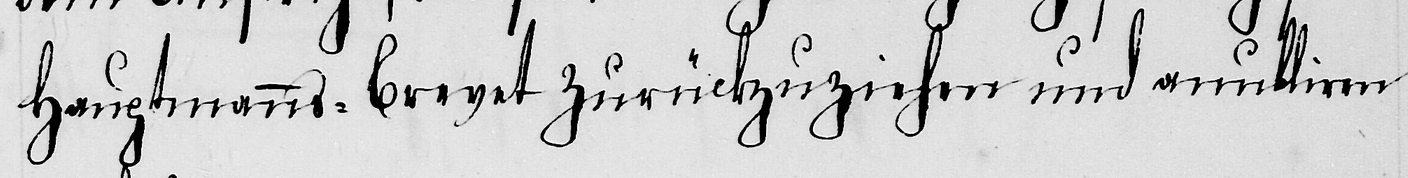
Hauptmanns-Brevet zurückzuziehen und anulliren
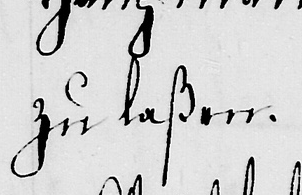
zu laßen.
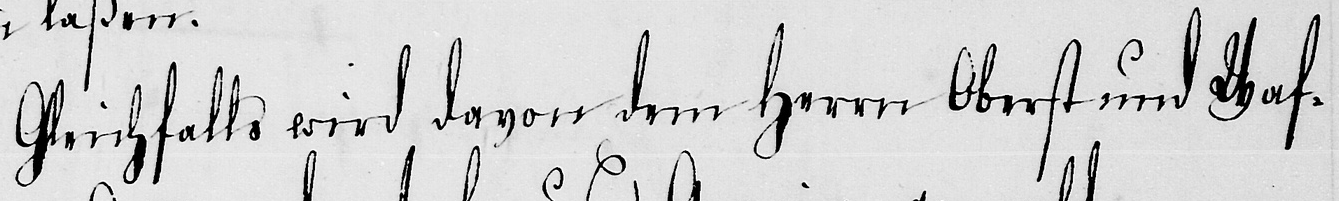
Gleichfalls wird davon dem Herrn Oberst und Waf¬
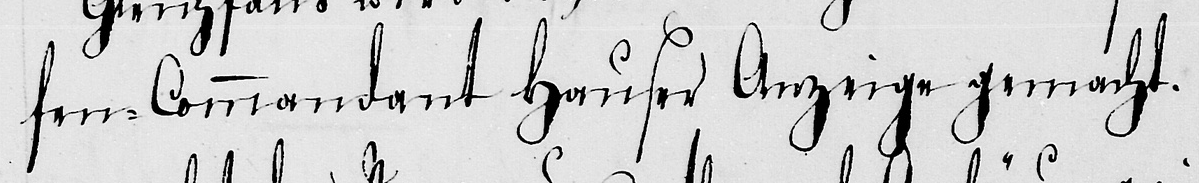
fen-Commandant Hauser Anzeige gemacht.
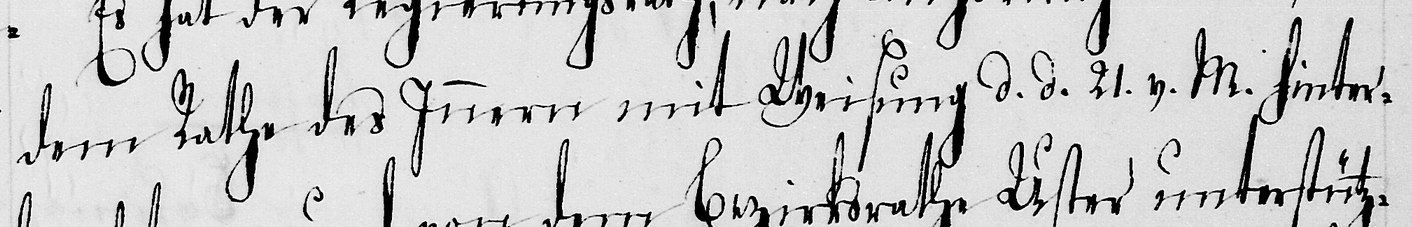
dem Rathe des Innern mit Weisung d. d. 21. v. M. hinter¬
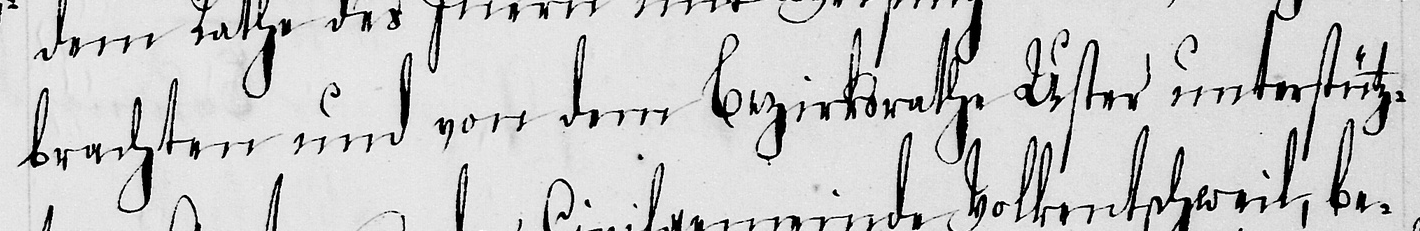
brachten und von dem Bezirksrathe Uster unterstütz¬
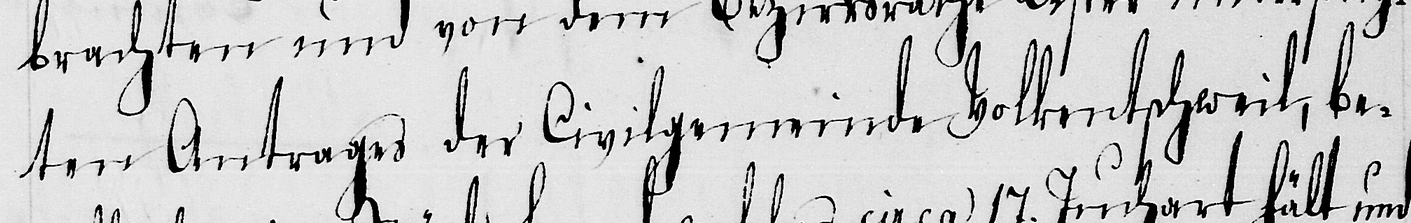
ten Antrages der Civilgemeinde Volkentschweil, b¬
